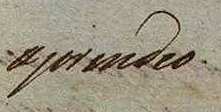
aprendeo.
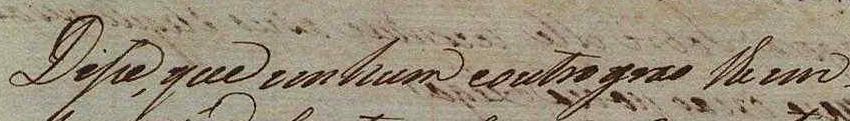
Disse, que em hum e outro graõ lhe em
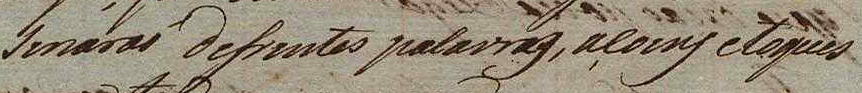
sinaraõ defrentes palavras, açoens e toques
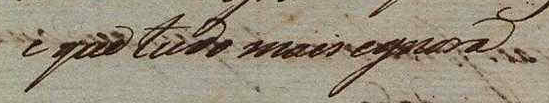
e que tudo mais egnora.
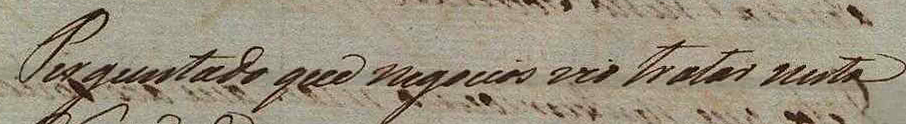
Perguntado que negocios vio tratar nesta
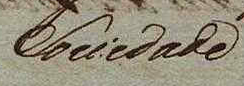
Sociedade
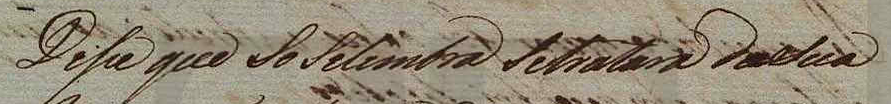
Disse que So Se lembra se tratara da sua
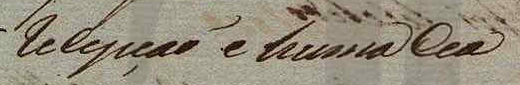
Recepçaõ e huma Cea
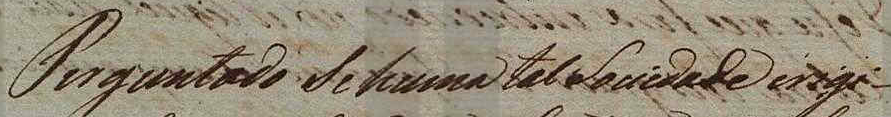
Perguntado se huma tal Sociedade erigi
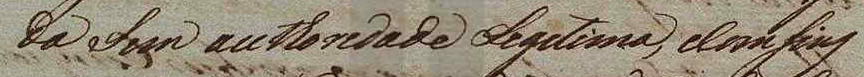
da Sem authoridade Legitima, e com fins
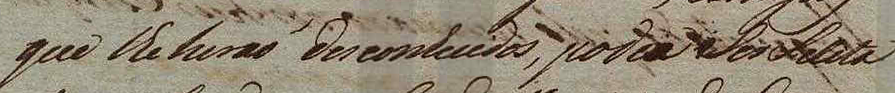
que lhe heraõ desconhecidos, podia Ser LeCita
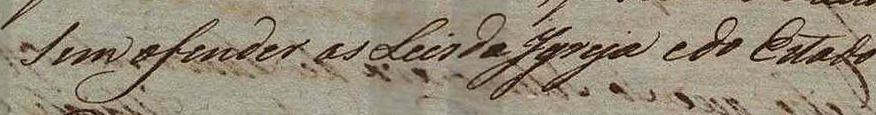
sem ofender as Leis da Jgreja e do Estado
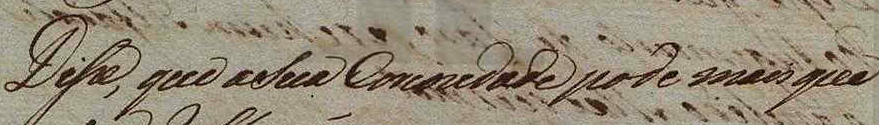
Disse, que a Sua Coriuzedade pode mais que
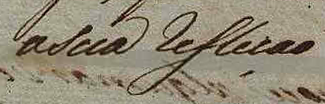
a sua Refleçaõ
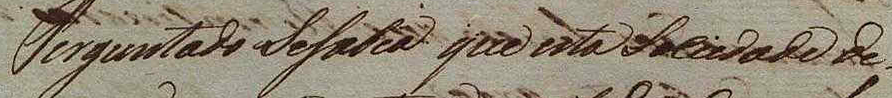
Perguntado Se sabia que esta Sociedade de
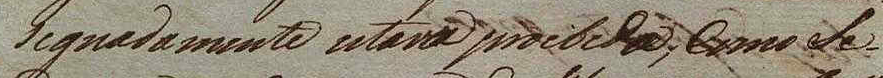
segnadamente estava proibida, Como Se
